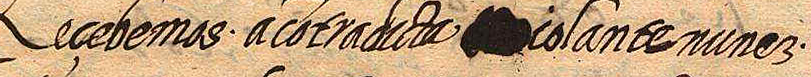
Recebemos a cōtradicta _iolante nunez
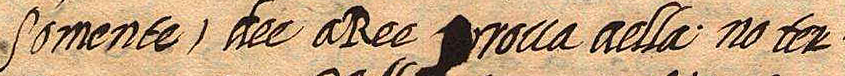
somente, dee a Ree _roua a ella no ter
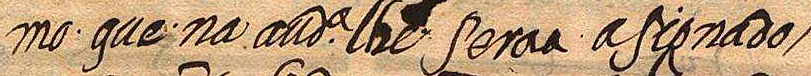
mo que na auda. lhe seraa asignado /
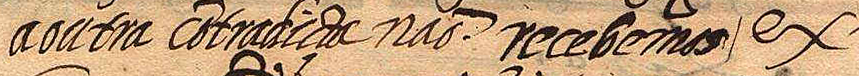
a outra cōtradicta naõ recebemos / ex
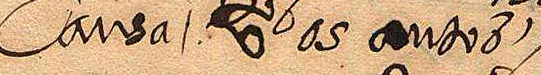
Causa /. vtos os autos /
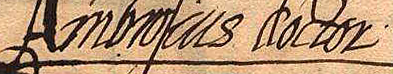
Ambrosius doctor
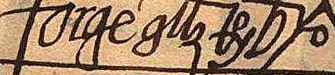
Jorge ḡllz Rybro
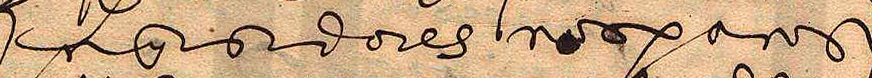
Jnq̄sidores nos paços
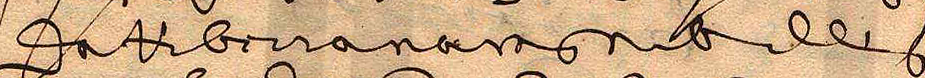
da Ribeira na casa do des
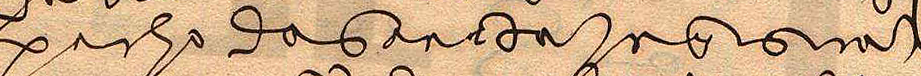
pacho da sancta Jnq̄eseçā
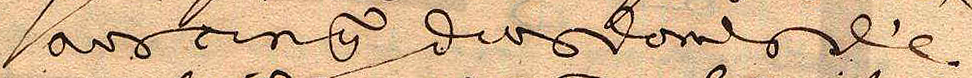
aos cinq̄o dias do mes de
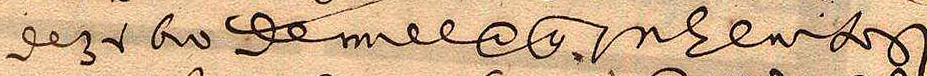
dezēbro de mill e q̄jnhentos
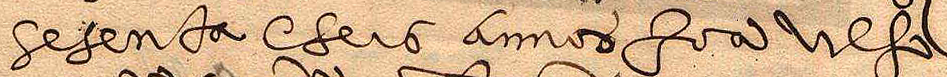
sesenta e seis annos Joā velho
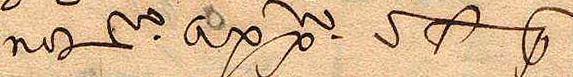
notro appco o stp̄uj
